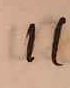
11
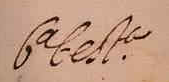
6a test.a
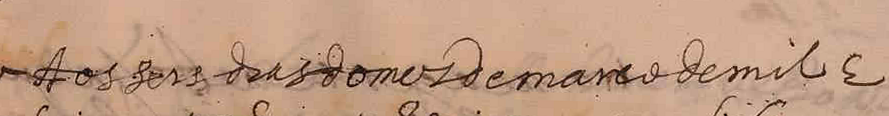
Aos seis dias do mez de março de mil E
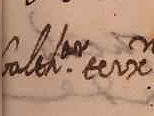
balth.ar teixra
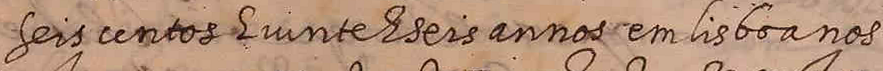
seiscentos E uinte E seis annos em lisboa nos
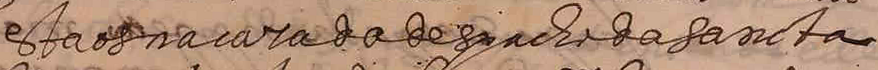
estaos na caza do despacho da Sancta
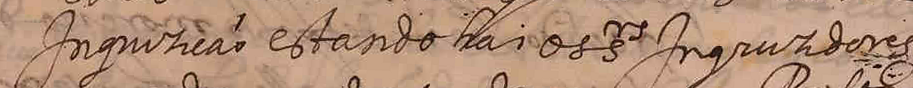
Jnquiziçaõ estando hai os srs Jnquizidores
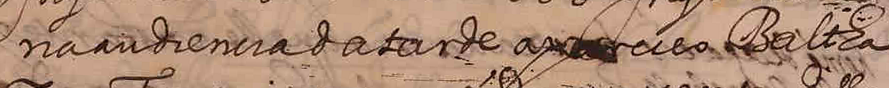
na audiencia da tarde apareceo Baltha
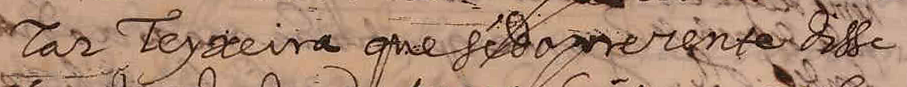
Zar Teyxeira que sēdo prezente disse
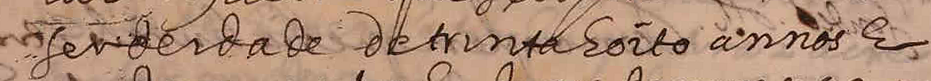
ser de idade de trinta E oito annos E
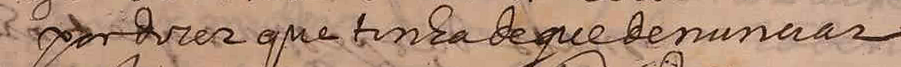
por dizer que tinha de que denunciar
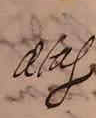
ætas
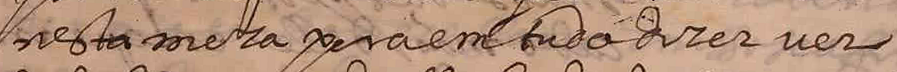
nesta meza pera em tudo dizer uer
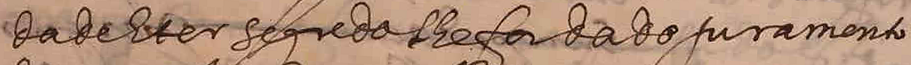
dade E ter segredo lhe foi dado juramento
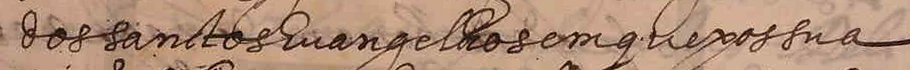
dos sanctos Euangelhos em que pos sua
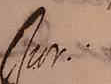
Jur.
